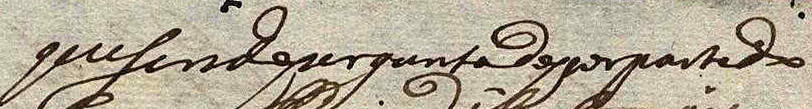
que sendo perguntado por parte do
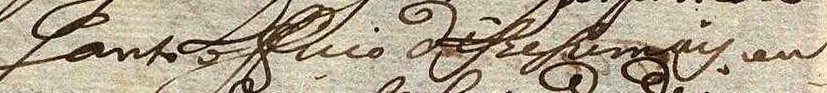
santo offiçio dissesse mais, ou
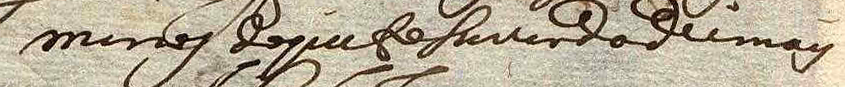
menos do que fosse verdade e mais
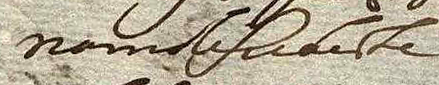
nam disse deste
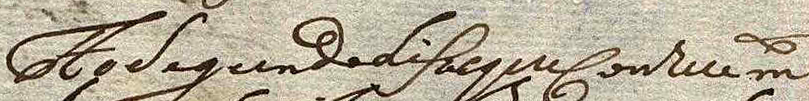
Ao segundo disse que Conhece mto
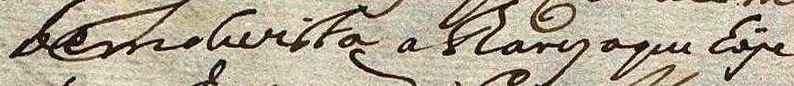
bem de vista a Thareza que hoje
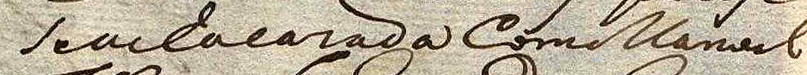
se acha cazada Com Manoel
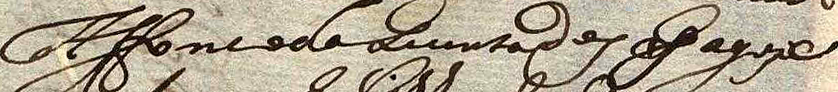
Affonco de Quinta dos Gagos e
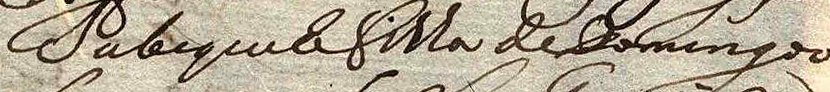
Sabe que he filha de Domingos
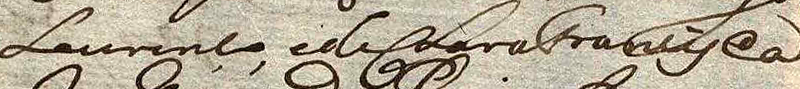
Lourenço, e de CLara Francisca
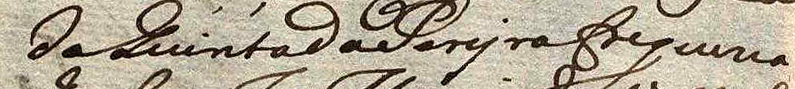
da Quinta da Perejra freguezia
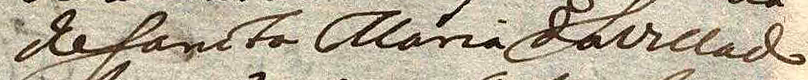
de Sancta Maria da villa do
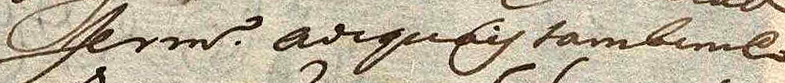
Jerm.o aos quais tambem co
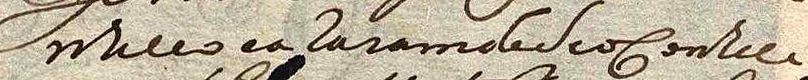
nheceo, e a Razam de Seo Conheci
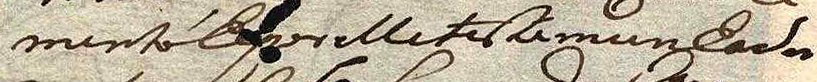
mento he por elle testemunha ser
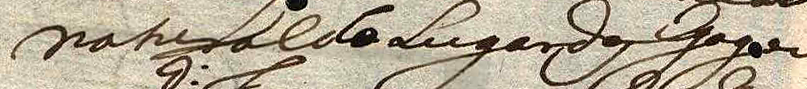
natural do Lugar dos Gagos
